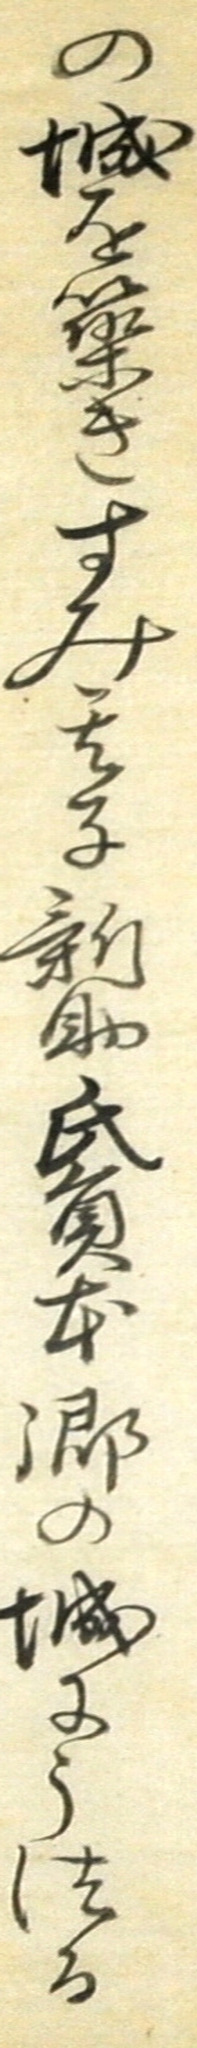の城を築きすみ其子新助氏員本郷の城にうつる
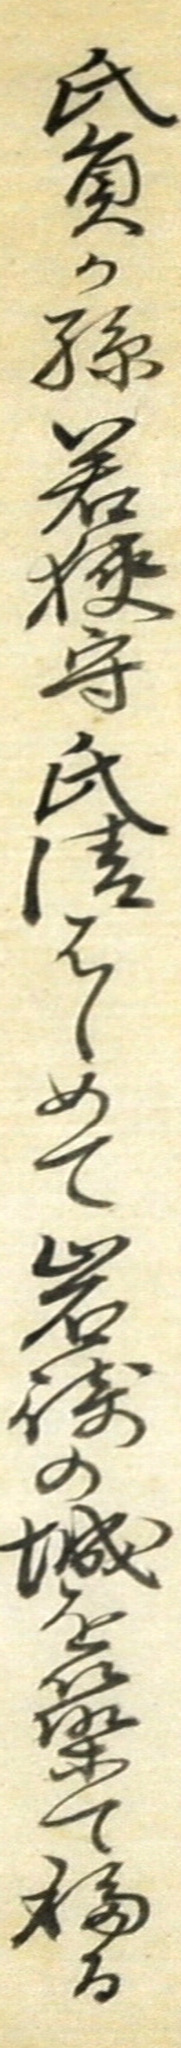氏員か孫若狭守氏清はしめて岩崎の城を築て移る
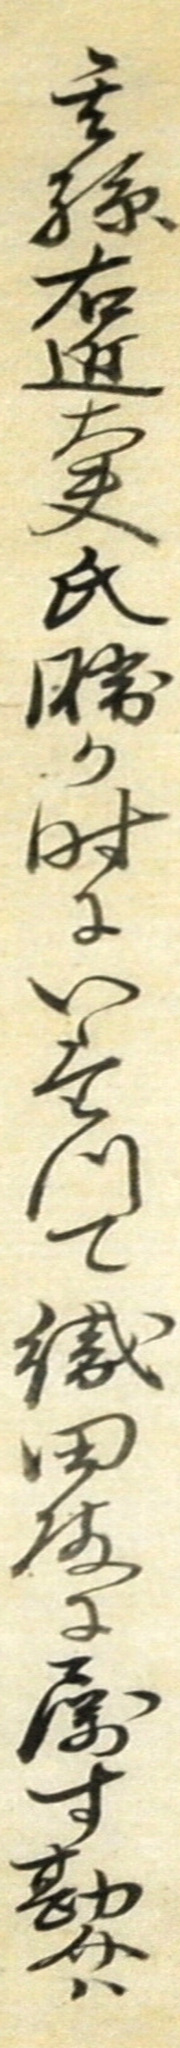其孫右近大夫氏勝か時にいたつて織田殿に属す勘介は
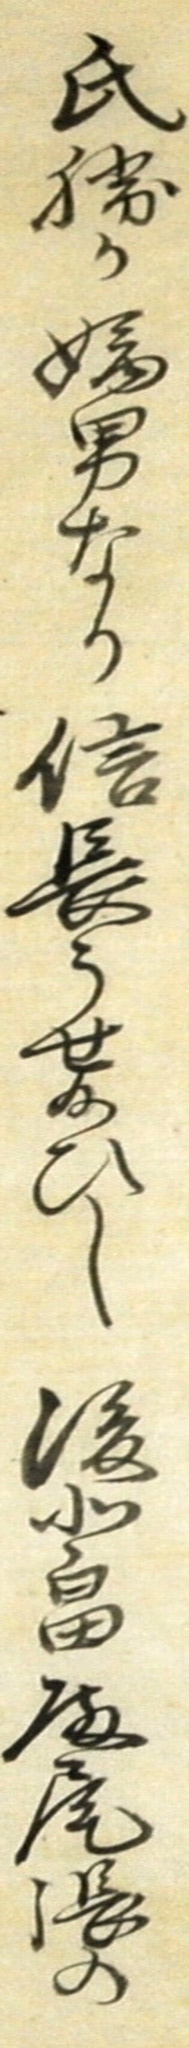氏勝か嫡男なり信長うせ給ひし後北畠殿尾張の
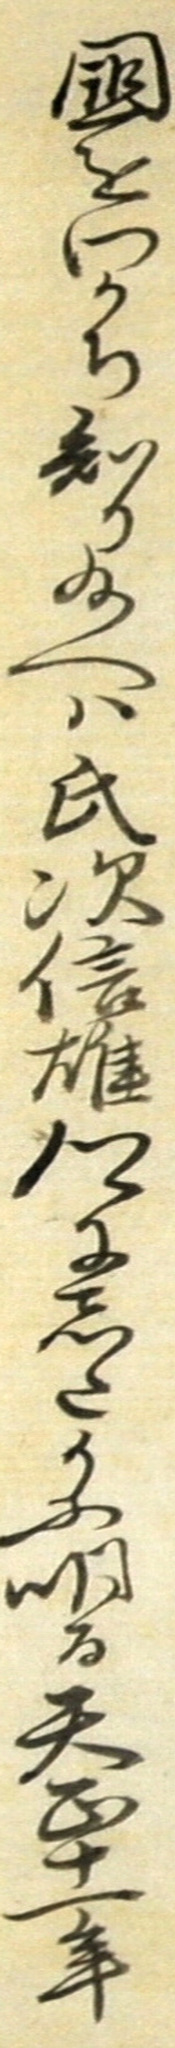国をわかち知り給へは氏次信雄卿にしたかふ明る天正十一年
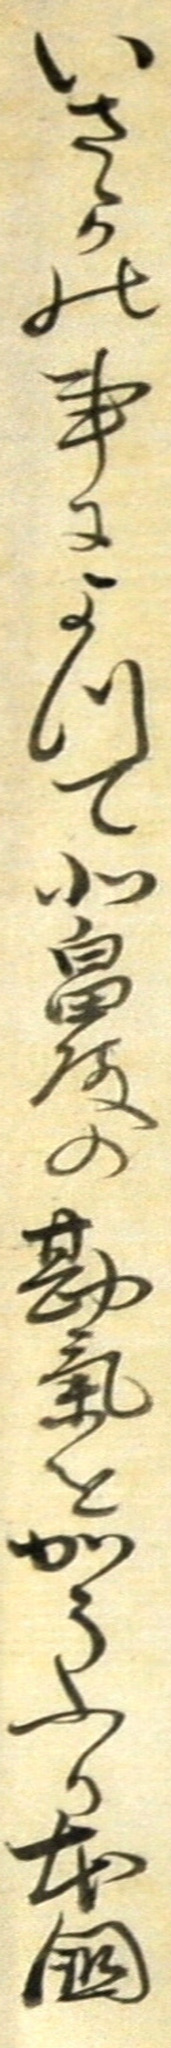いさゝかの事によつて北畠殿の勘気をかうふり本国

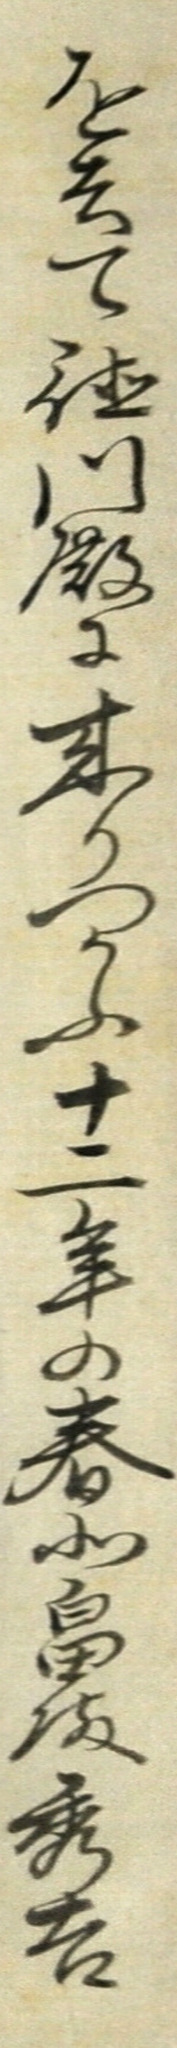を去て徳川殿に来りつかふ十二年の春北畠殿秀吉
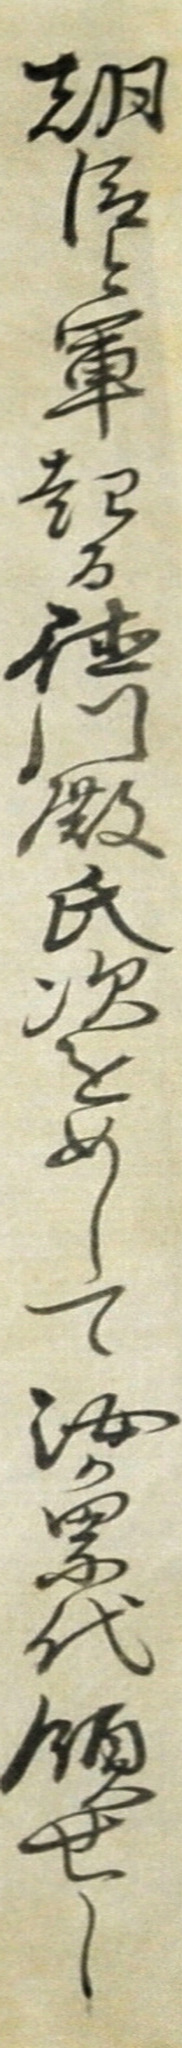朝臣と軍起る徳川殿氏次をめして汝か累代領せし
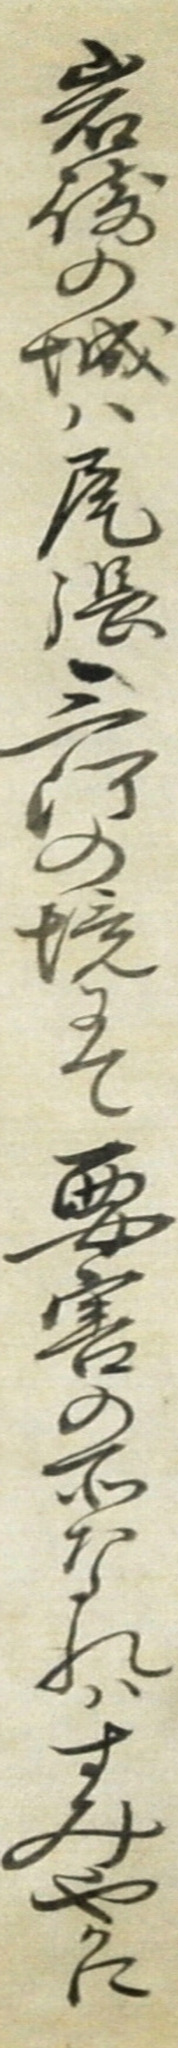岩崎の城は尾張三河の境にて要害の所なれはすみやかに
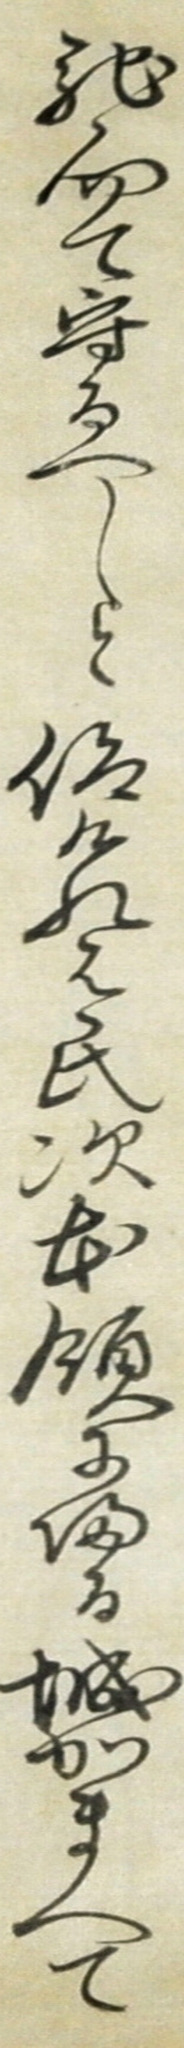馳向て守るへしと仰けれは氏次本領に帰る城かまへて
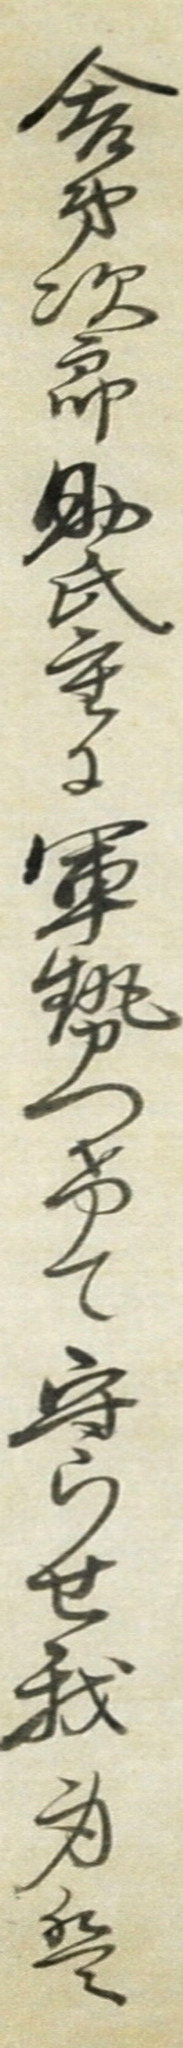舎弟次郎助氏重に軍勢つけて守らせ我身は
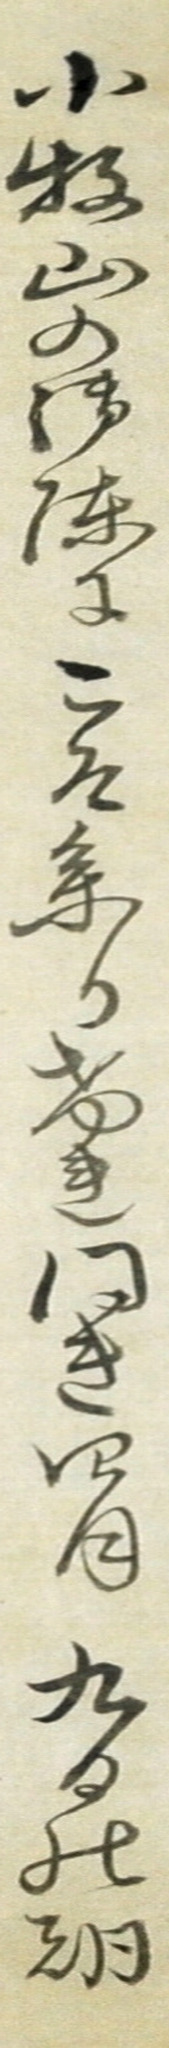小牧山の御陣にこそ参りけれ同き四月九日の朝
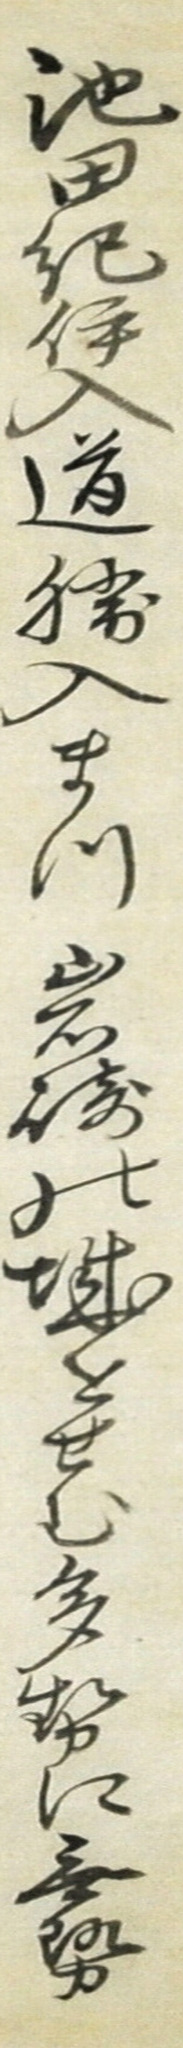池田紀伊入道勝入まつ岩崎の城をせむ多勢に無勢
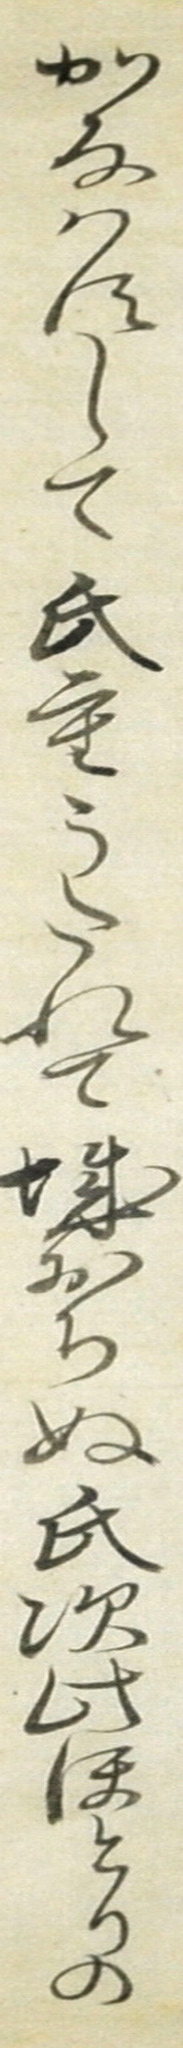かなはすして氏重うたれて城おちぬ氏次此ほとりの
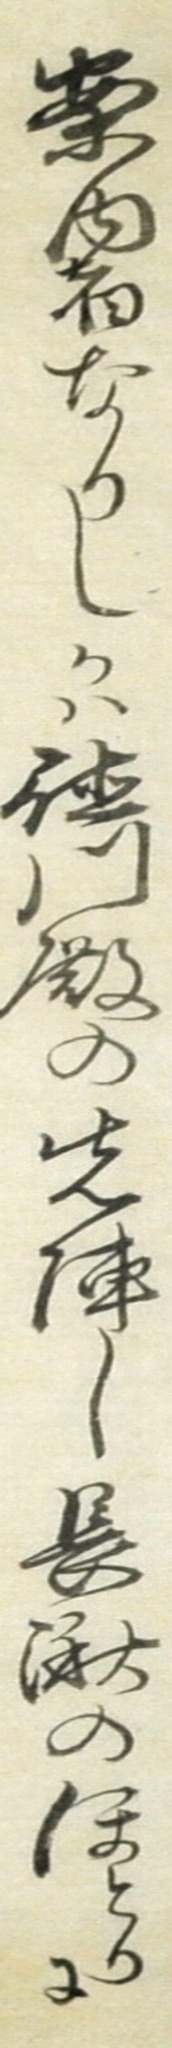案内者なりしかは徳川殿の先陣し長湫のほとりに
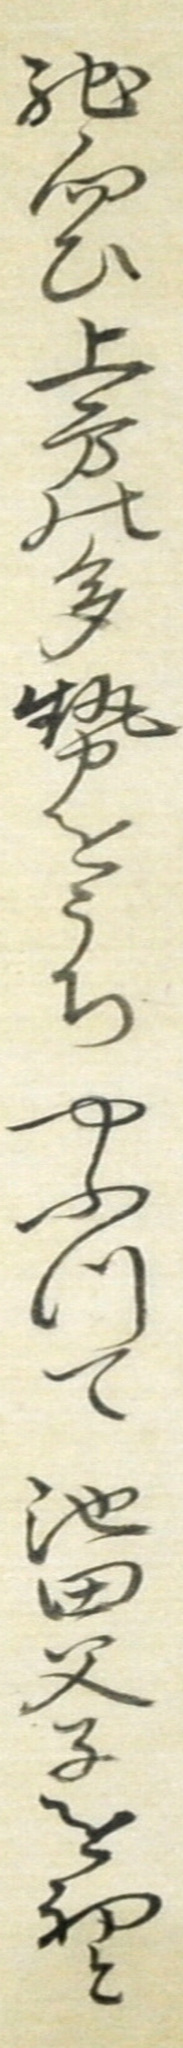馳向ひ上方の多勢をうちやふつて池田父子を初と
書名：藩翰譜（六）
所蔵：伊那市立高遠町図書館・合同会社AMANE
